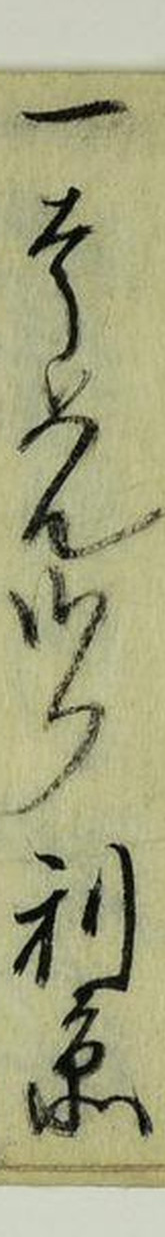一そうめん弐つ利兵衛
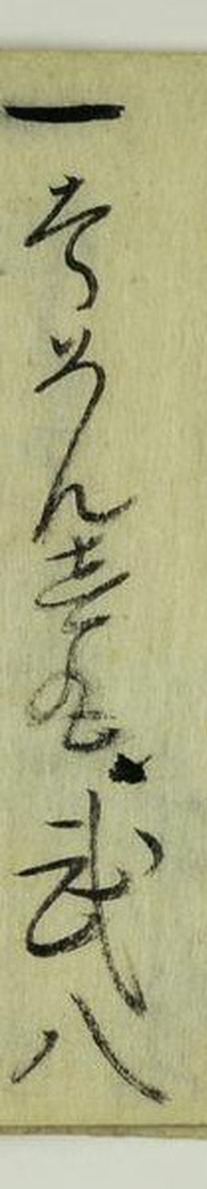一そうめん壱丸武八
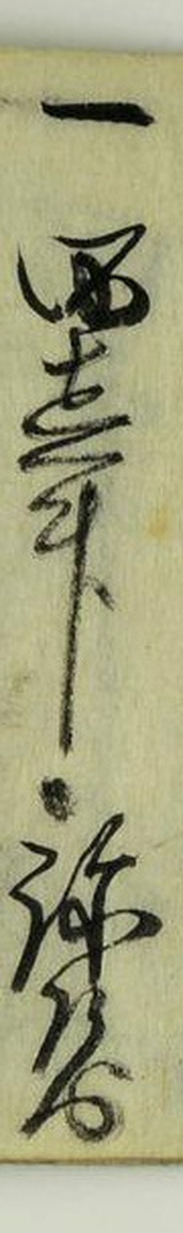一酒壱升弥左衛門
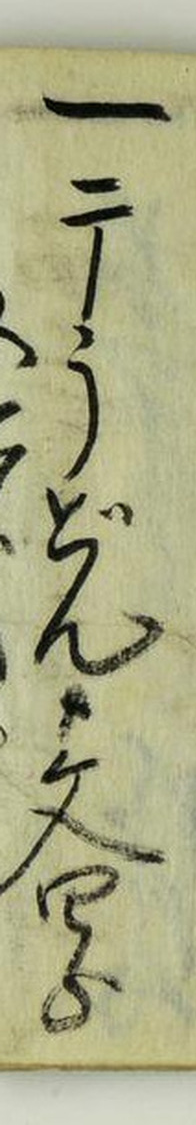一干うどん文四郎

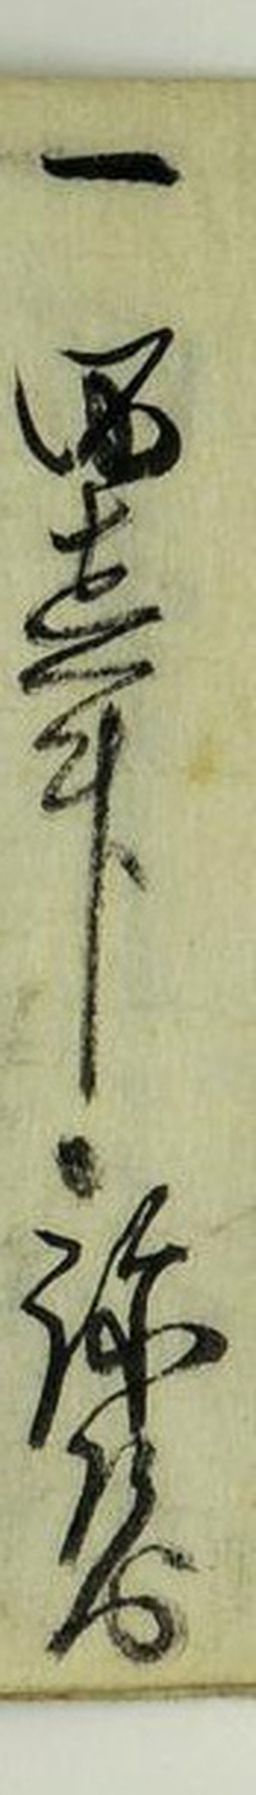一酒壱升惣右衛門
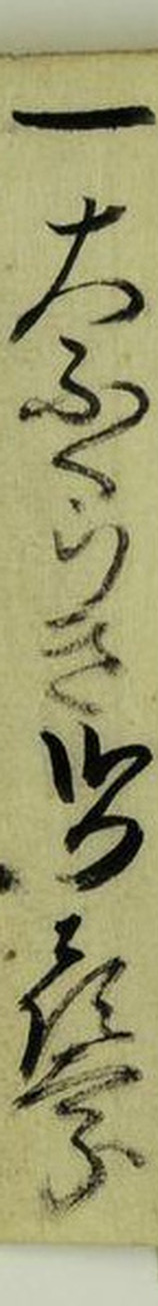一大ふくらき弐つ彦太郎
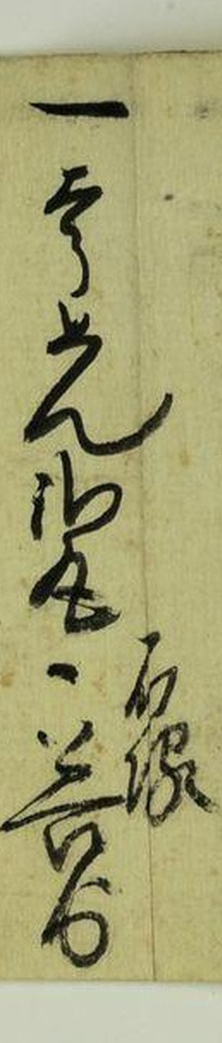一そうめん弐丸善右衛門
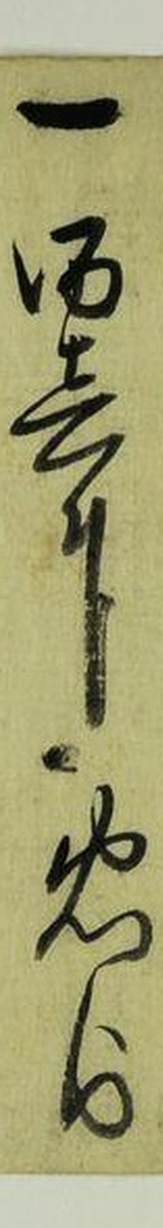一酒壱升忠右衛門
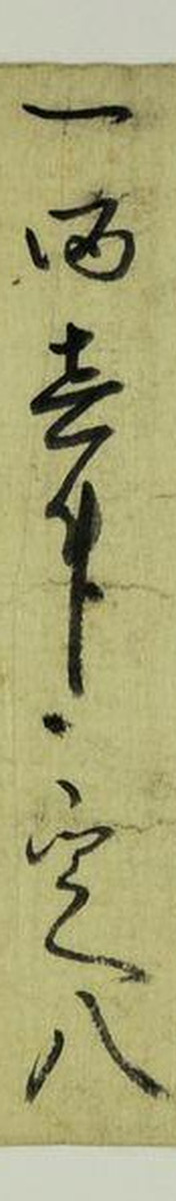一酒壱升定八
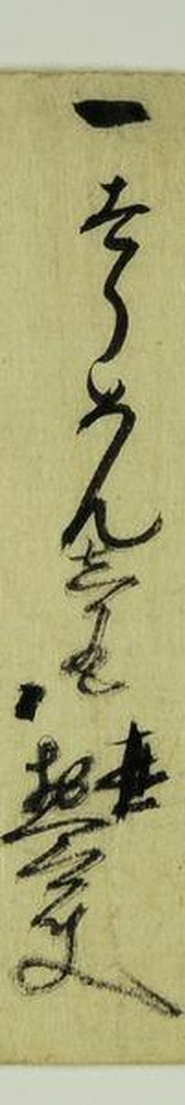一そうめん壱丸惣太夫
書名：松五郎参宮はなむけ并留守見舞
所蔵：福井県文書館 Fukui Prefectural Archives
